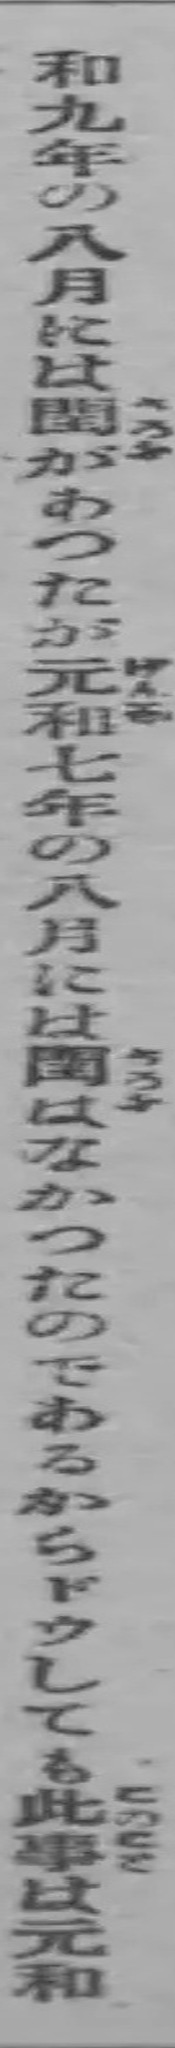和九年の八月には閏があつたが元和七年の八月には閏はなかつたのであるからドウしても此事は元和
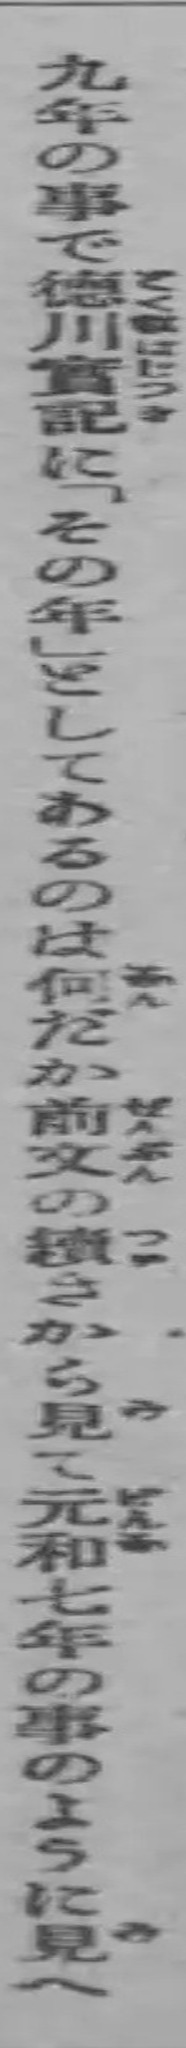九年の事で徳川実記に「その年」としてあるのは何だか前文の続きから見て元和七年の事のように見へ
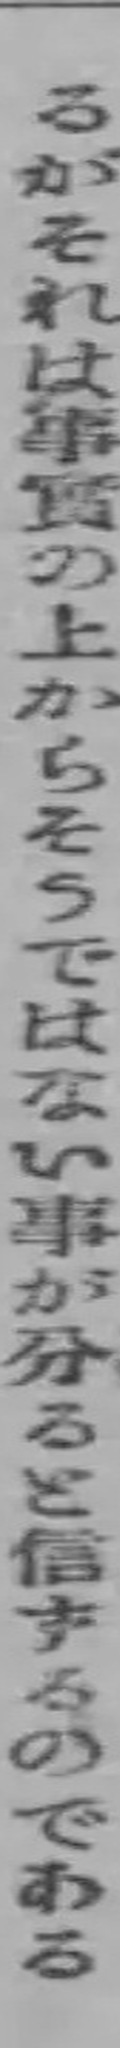るがそれは事実の上からそうではない事が分ると信ずるのである
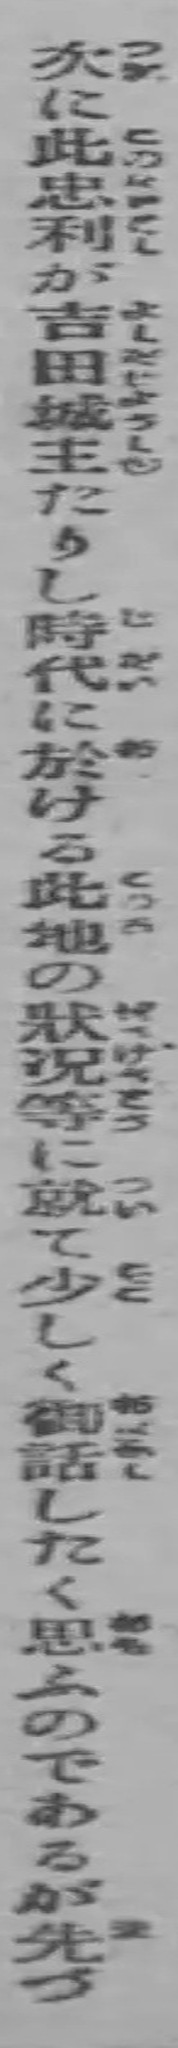丙辰紀行次に此忠利が吉田城主たりし時代に於ける此地の状況等に就て少しく御話したく思ふのであるが先づ
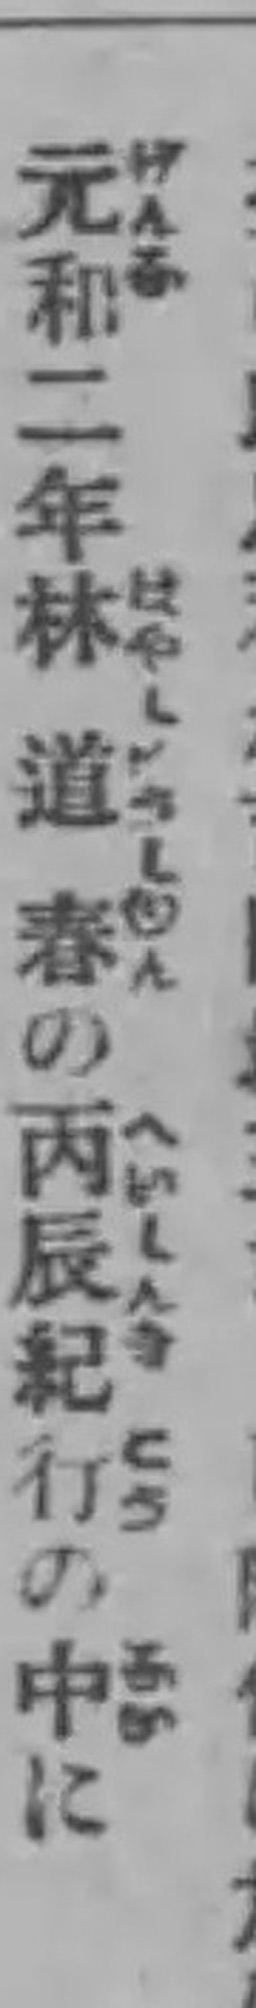元和二年林道春の丙辰紀行の中に
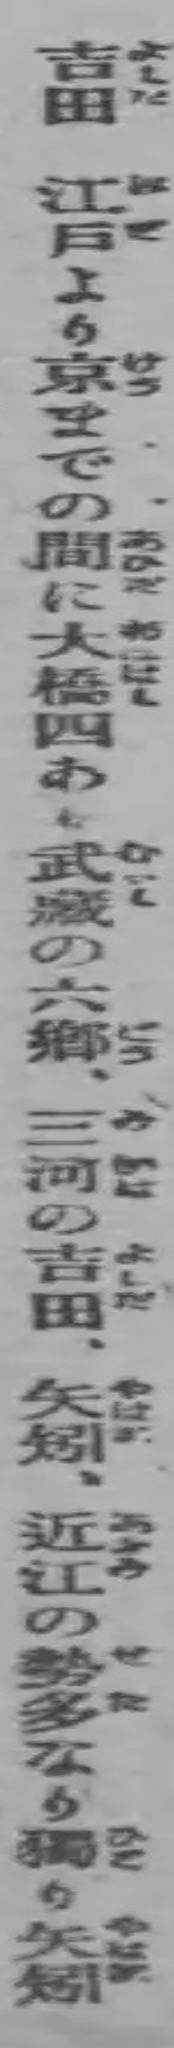吉田江戸より京までの間に大橋四あり武蔵の六郷、三河の吉田、矢矧、近江の勢多なり独り矢矧
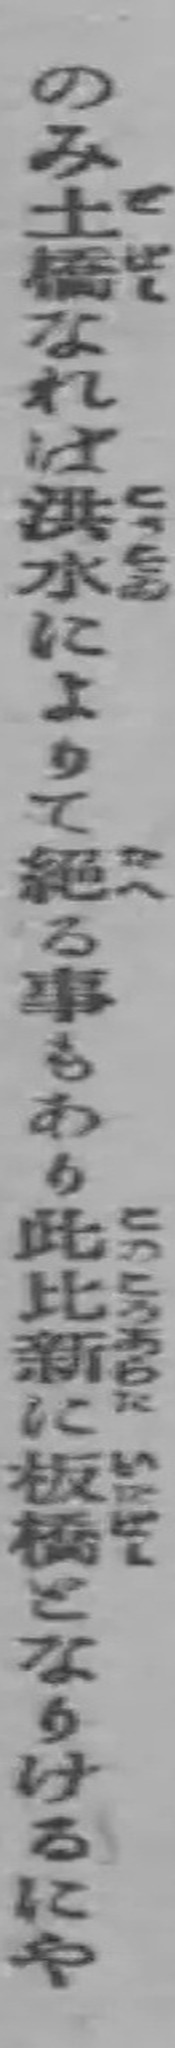のみ土橋なれば洪水によりて絶る事もあり此比新に板橋となりけるにや
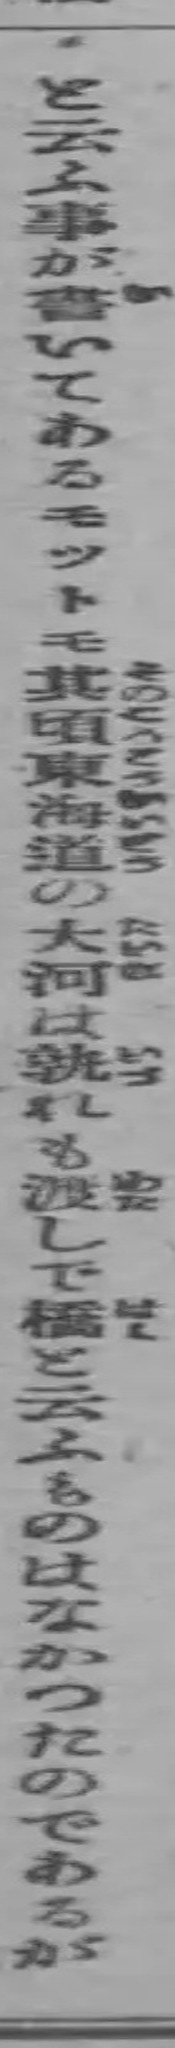吉田の大橋と云ふ事が書いてあるモツトモ其頃東海道の大河は孰れも渡しで橋と云ふものはなかつたのであるが

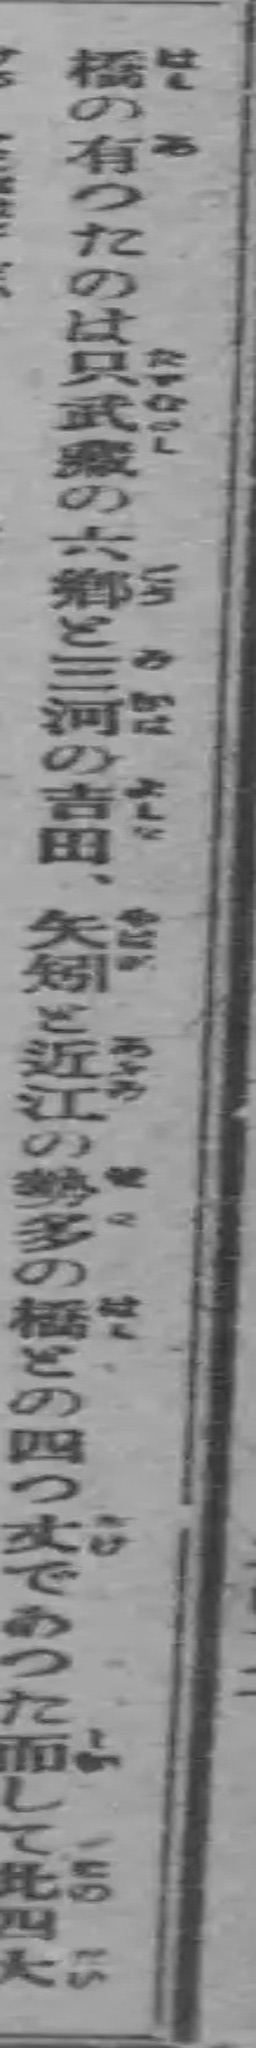橋の有つたのは只武蔵の六郷と三河の吉田、矢矧と近江の勢多の橋との四つ丈であつた而して此四大
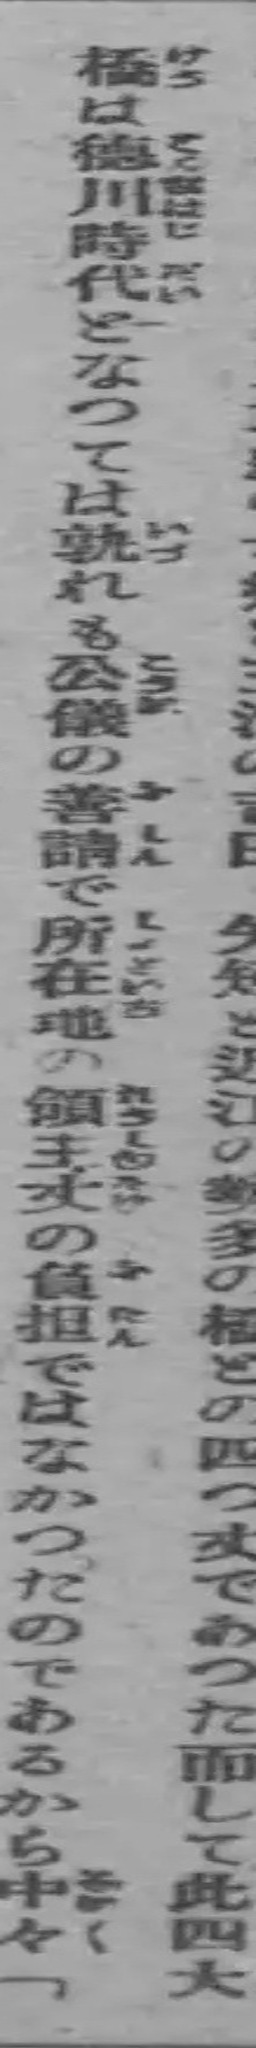橋は徳川時代となつては孰れも公儀の普請で所在地の領主丈の負担ではなかつたのであるから中々「
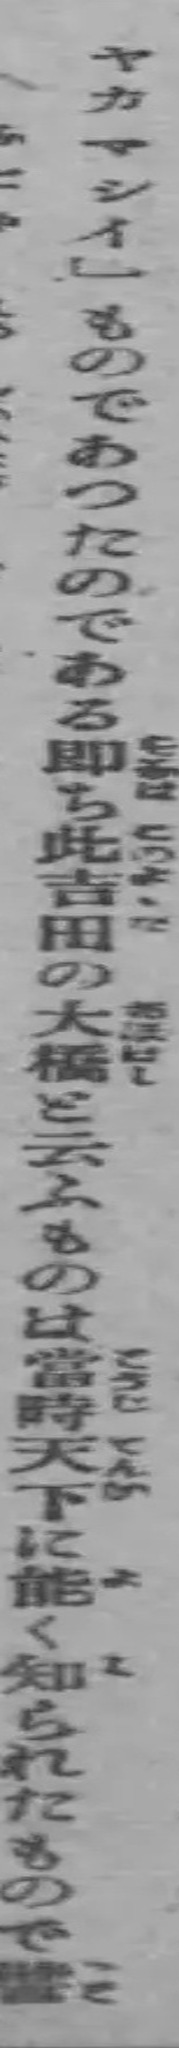ヤカマシイ」ものであつたのである即ち此吉田の大橋と云ふものは当時天下に能く知られたもので譬
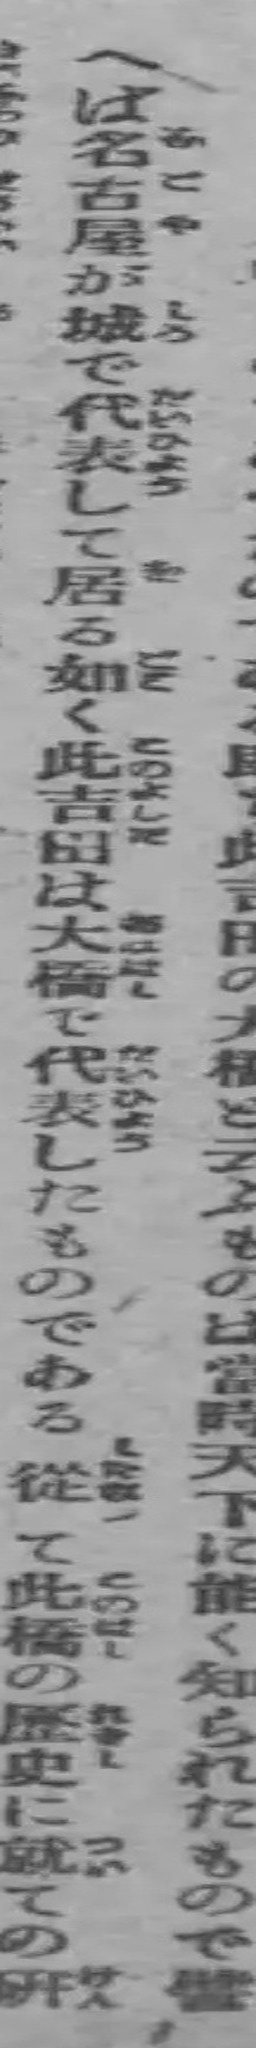へば名古屋が城で代表して居る如く此吉田は大橋で代表したものである従て此橋の歴史に就ての研
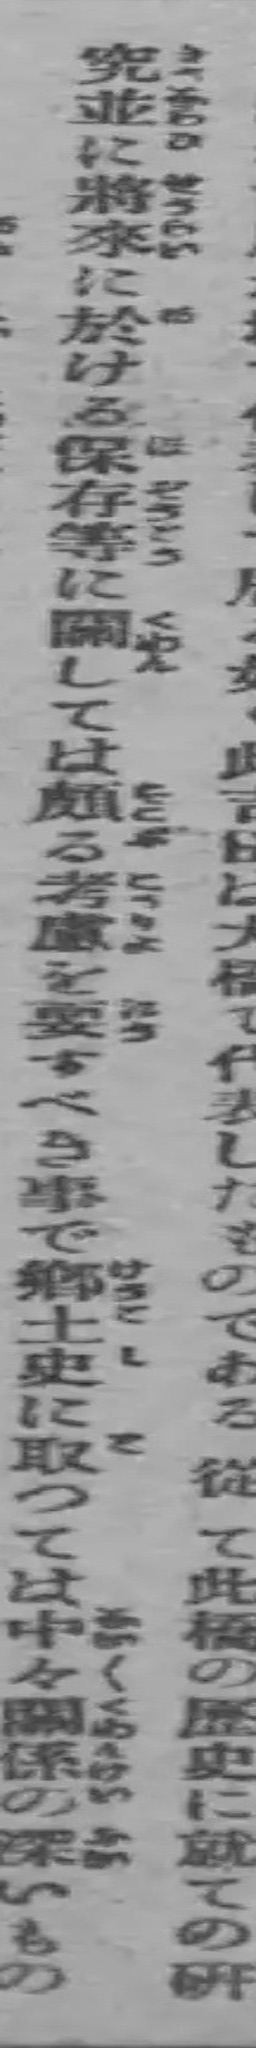究並に将来に於ける保存等に関しては頗る考慮を要すべき事で郷土史に取つては中々関係の深いもの
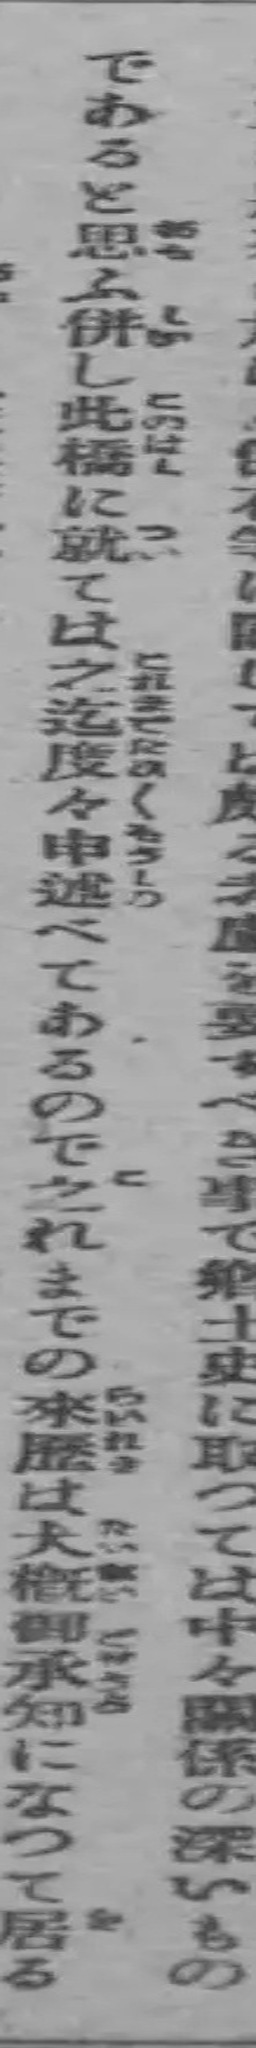であると思ふ併し此橋に就ては之迄度々申述べてあるので之れまでの来歴は大概御承知になつて居る
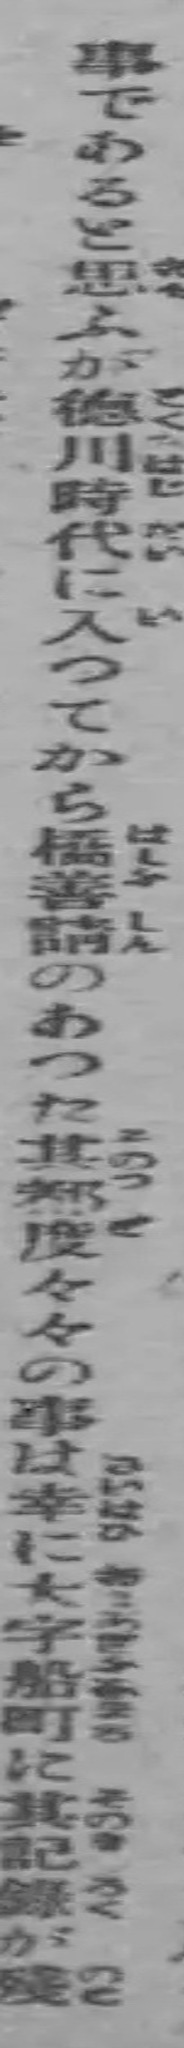事であると思ふが徳川時代に入つてから橋普請のあつた其都度々々の事は幸に大字船町に其記録が残
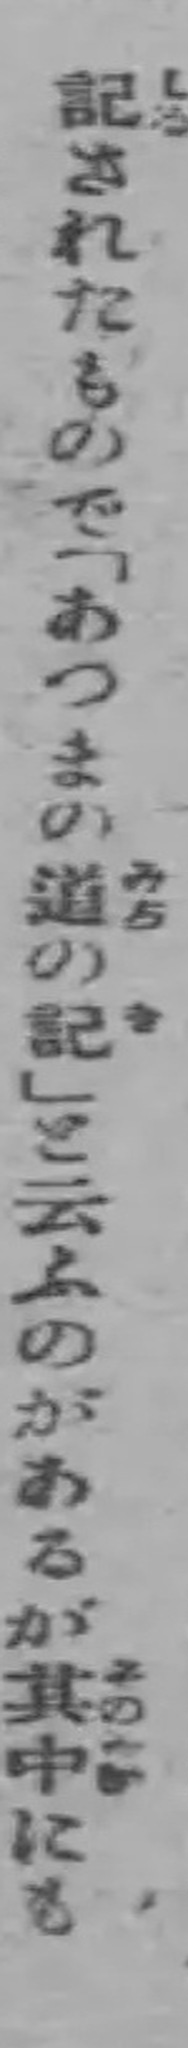記されたもので「あつまの道の記」と云ふのがあるが其中にも
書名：豊橋市史談
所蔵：国立国会図書館 National Diet Library, JAPAN
